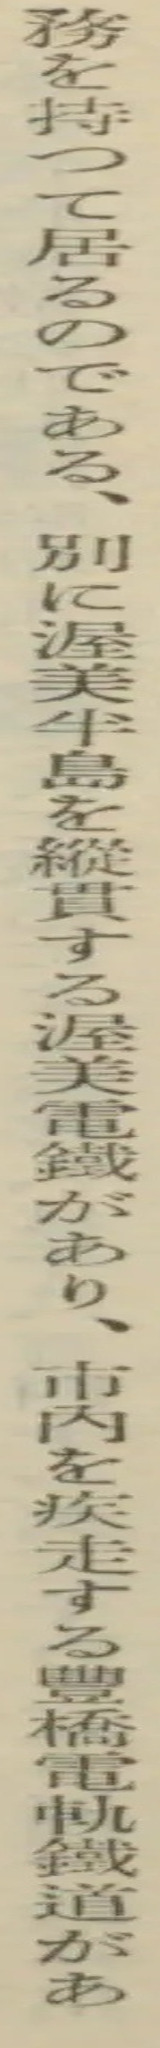務を持つて居るのである、別に渥美半島を縦貫する渥美電鉄があり、市内を疾走する豊橋電軌鉄道があ
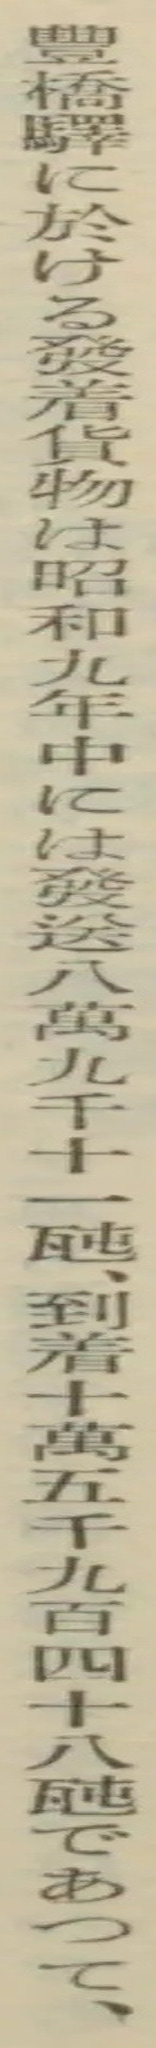豊橋駅に於ける発着貨物は昭和九年中には発送八万九千十一瓲、到着十万五千九百四十八瓲であつて、
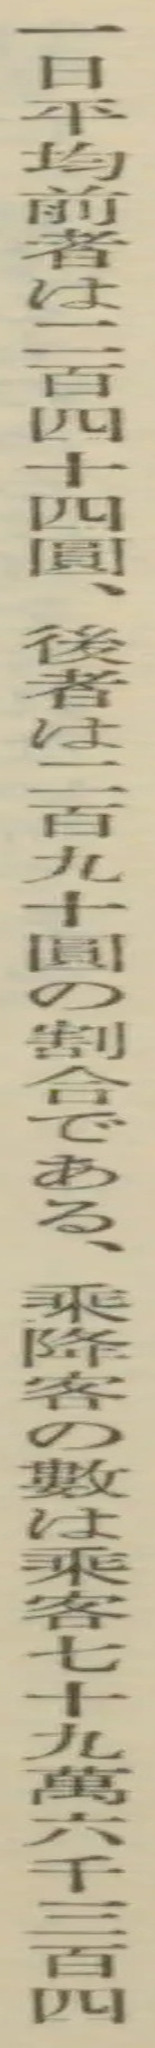一日平均前者は二百四十四円、後者は二百九十円の割合である、乗降客の数は乗客七十九万六千三百四
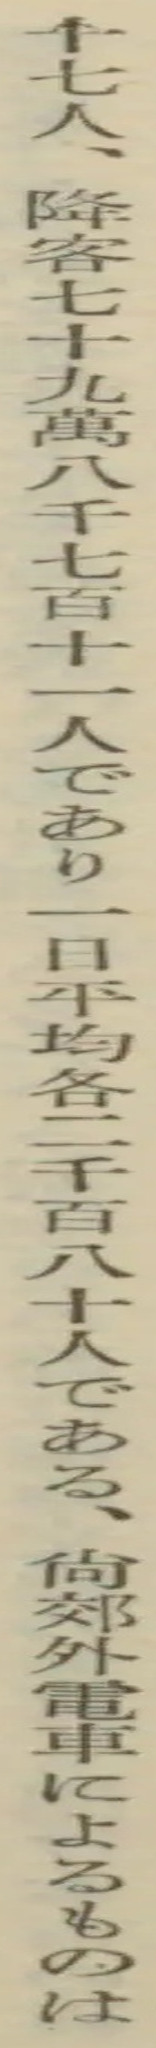十七人、降客七十九万八千七百十一人であり一日平均各二千百八十人である、尚郊外電車によるものは
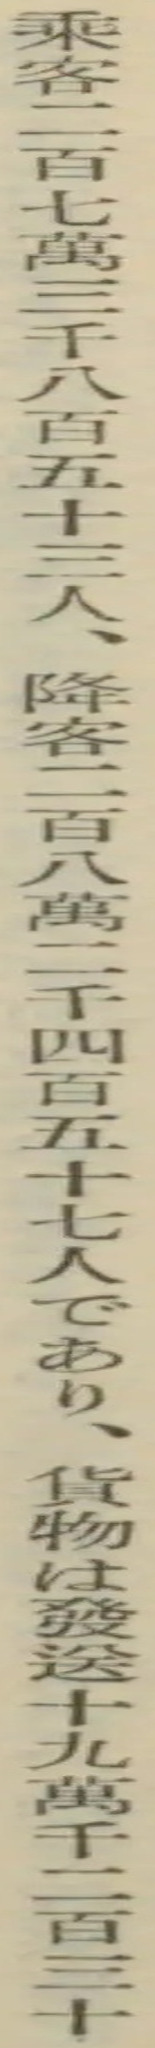乗客二百七万三千八百五十三人、降客二百八万二千四百五十七人であり、貨物は発送十九万千二百三十
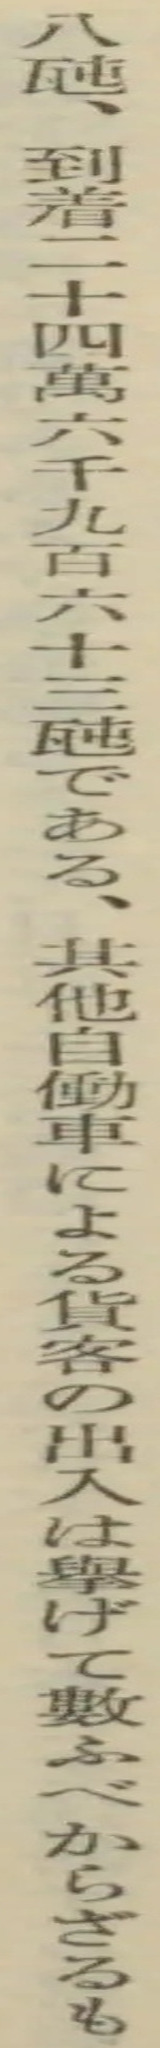八瓲、到着二十四万六千九百六十三瓲である、其他自働車による貨客の出入は挙げて数ふべからざるも
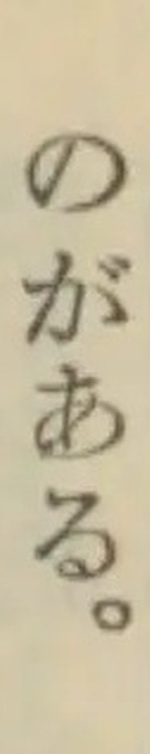のがある。
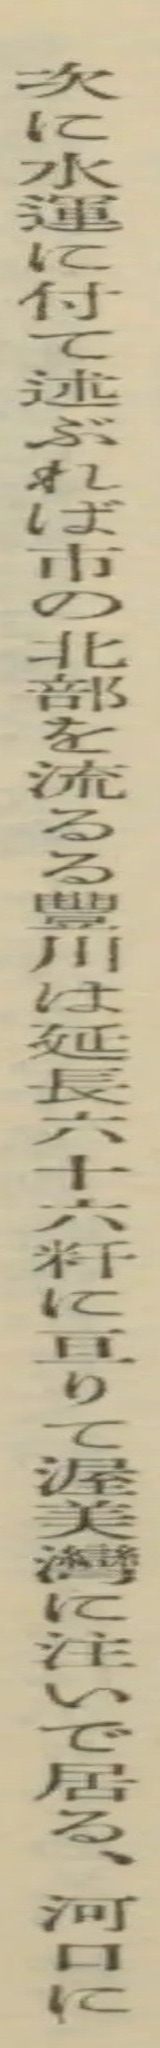次に水運に付て述ぶれば市の北部を流るる豊川は延長六十六粁に亘りて渥美湾に注いで居る、河口に

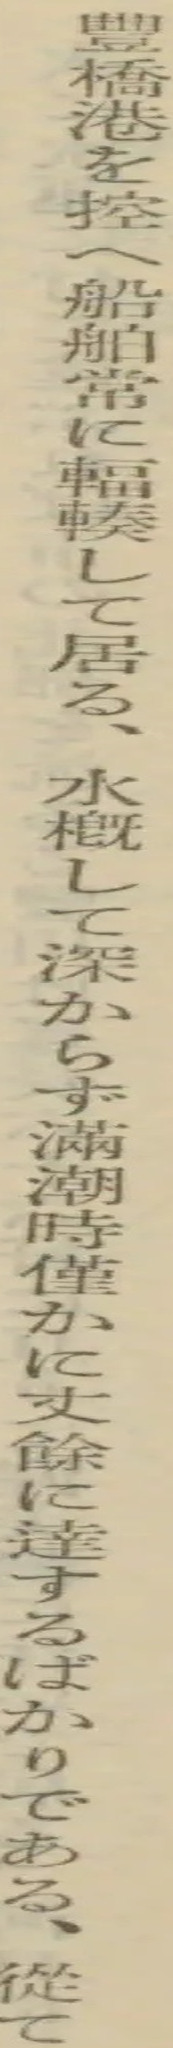豊橋港を控え船舶常に輻輳して居る、水概して深からず満潮時僅かに丈余に達するばかりである、従て
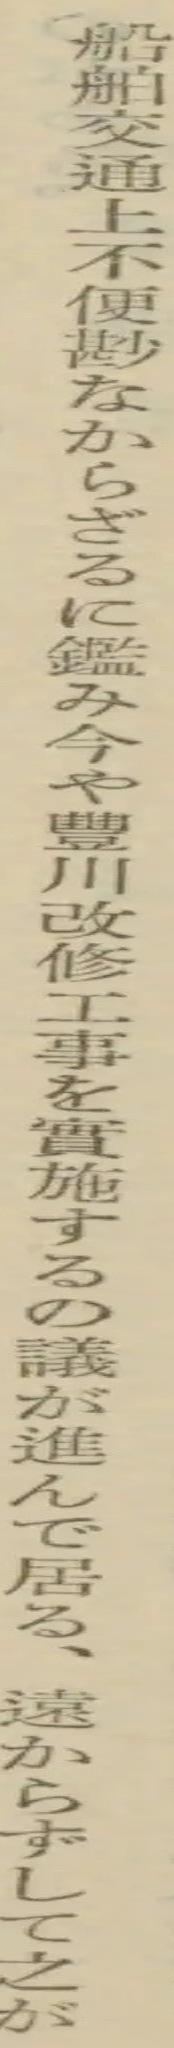船舶交通上不便尠なからざるに鑑み今や豊川改修工事を実施するの議が進んで居る、遠からずして之が
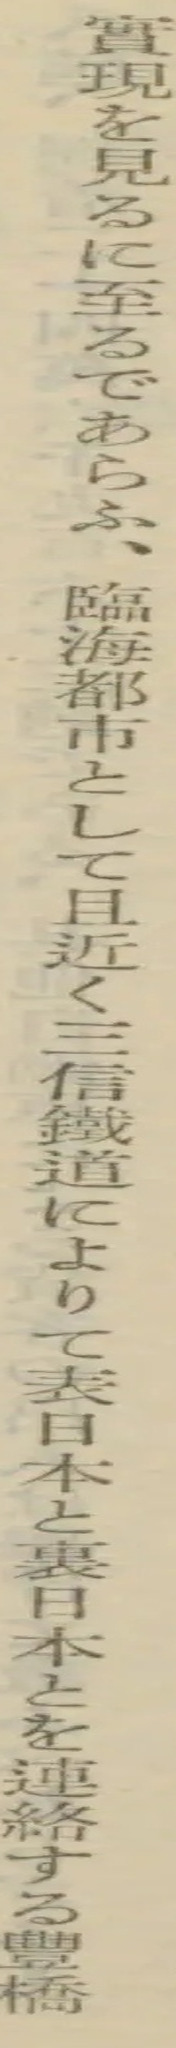実現を見るに至るであらふ、臨海都市として且近く三信鉄道によりて表日本と裏日本とを連絡する豊橋
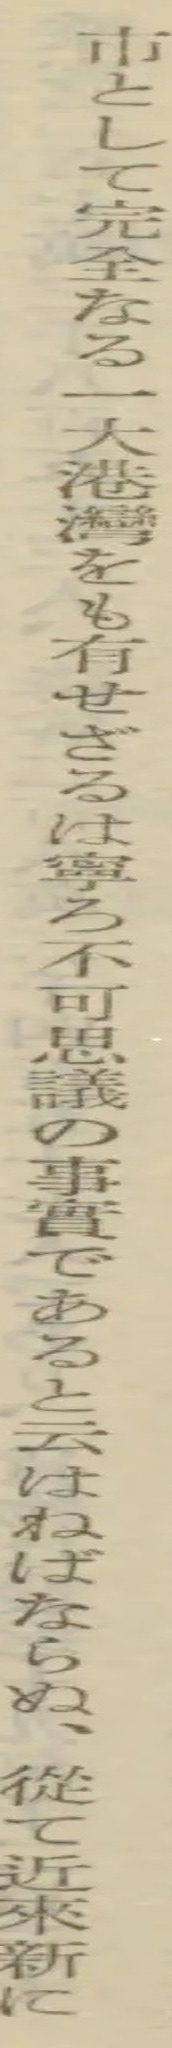市として完全なる一大港湾をも有せざるは寧ろ不可思議の事実であると云はねばならぬ、従て近来新に
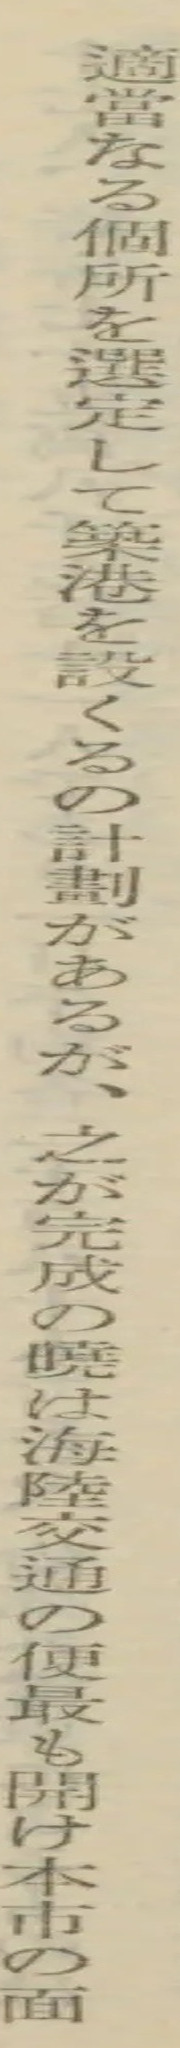適当なる個所を選定して築港を設くるの計画があるが、之が完成の暁は海陸交通の便最も開け本市の面
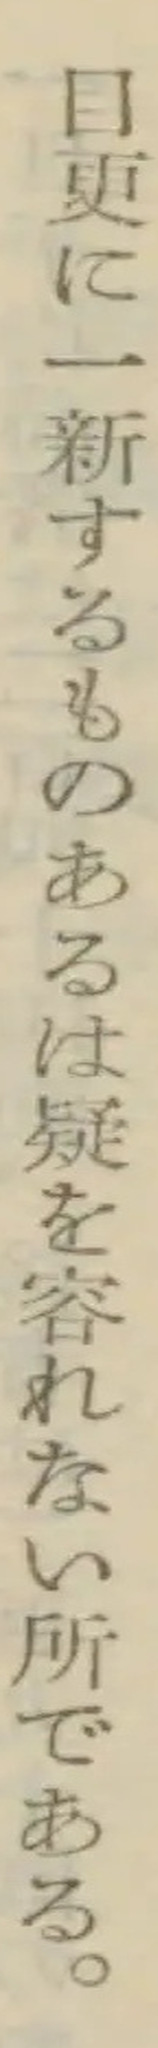目更に一新するものあるは疑を容れない所である。
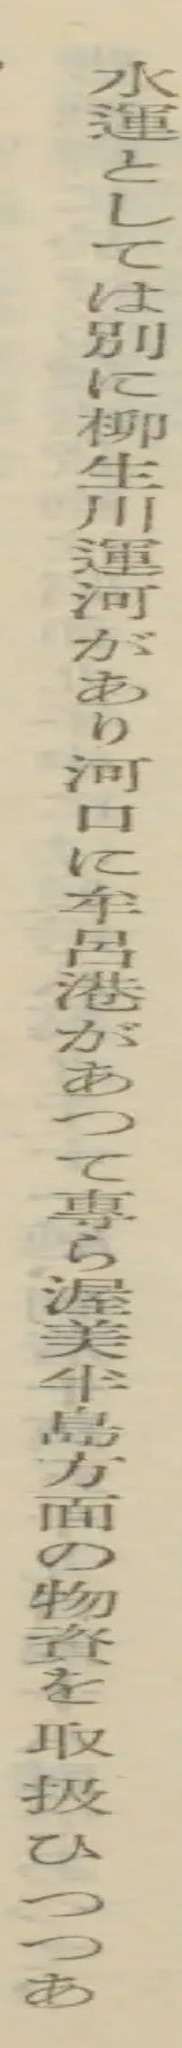水運としては別に柳生川運河があり河口に牟呂港があつて専ら渥美半島方面の物資を取扱ひつつあ
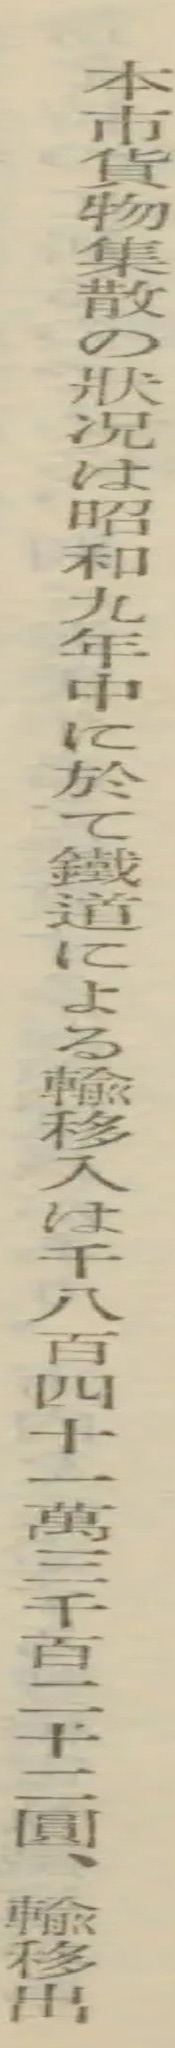本市貨物集散の状況は昭和九年中に於て鉄道による輸移入は千八百四十一万三千百二十二円、輸移出
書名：産業の豊橋
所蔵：国立国会図書館 National Diet Library, JAPAN
